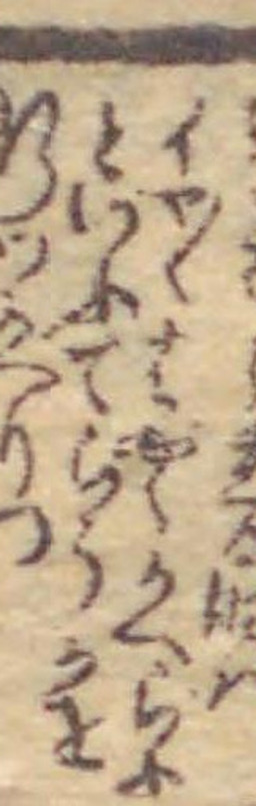といふてらうかを
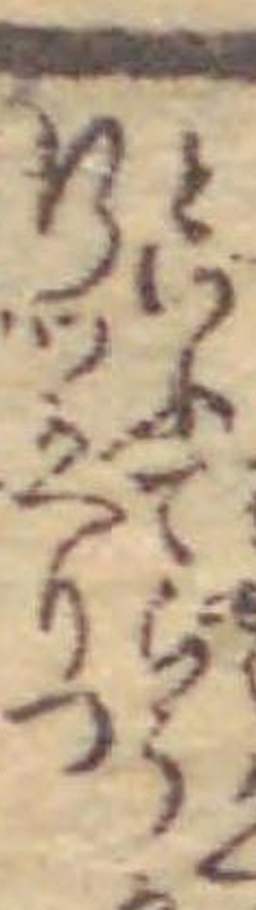行つかへりつ
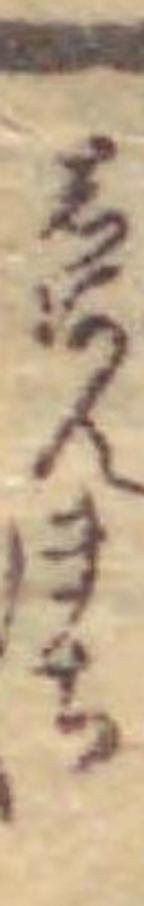しあんまち
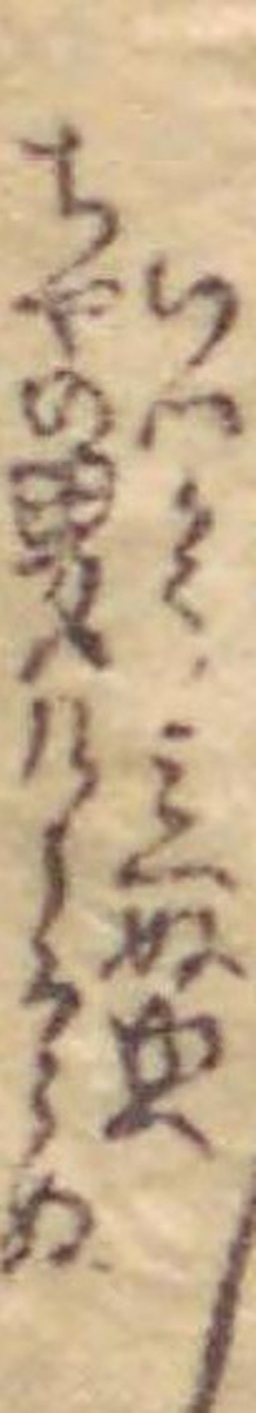ちやの男はけしからぬ
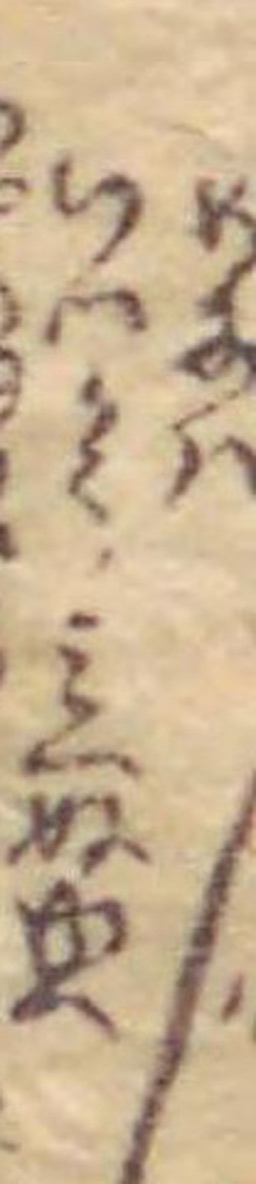いつかうみへぬゆへ
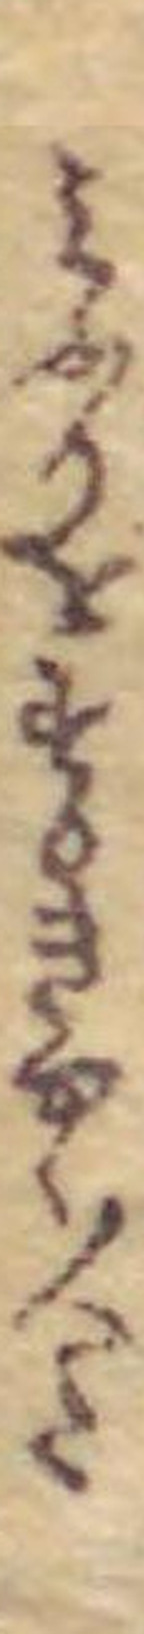みふりをするきやく人た

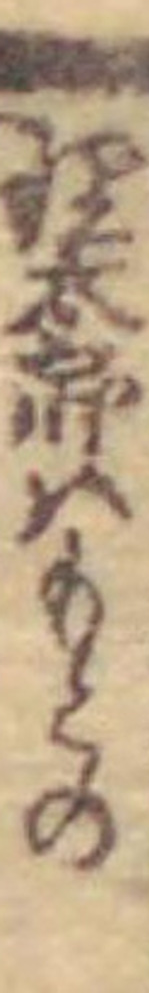理太郎はもとの
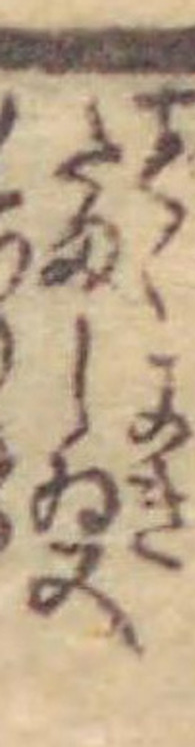たましゐ又
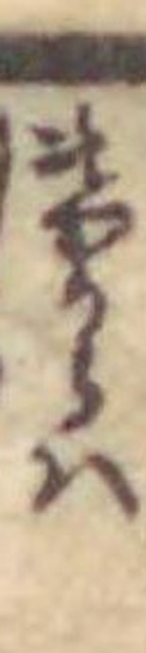けからは
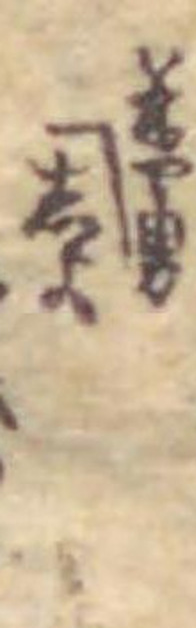〽しよ
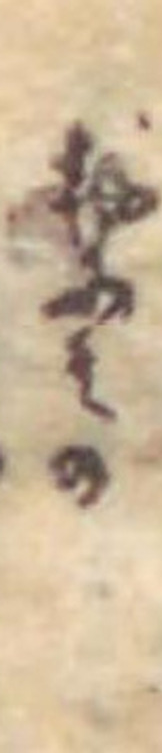おふみの
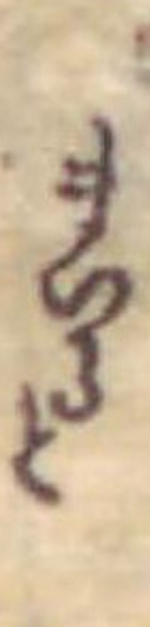まいると
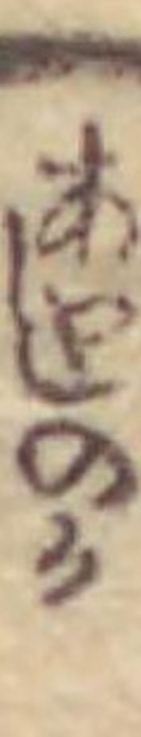あやしのか
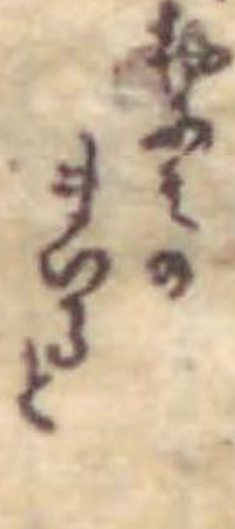まいると
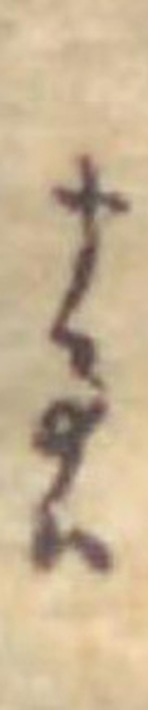申事は
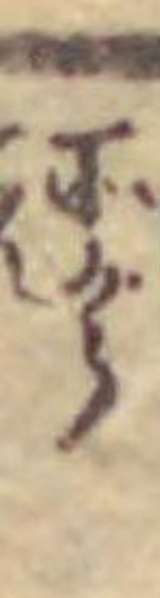所から
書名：心学早染艸 : 3巻
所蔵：国立国会図書館 National Diet Library, JAPAN
